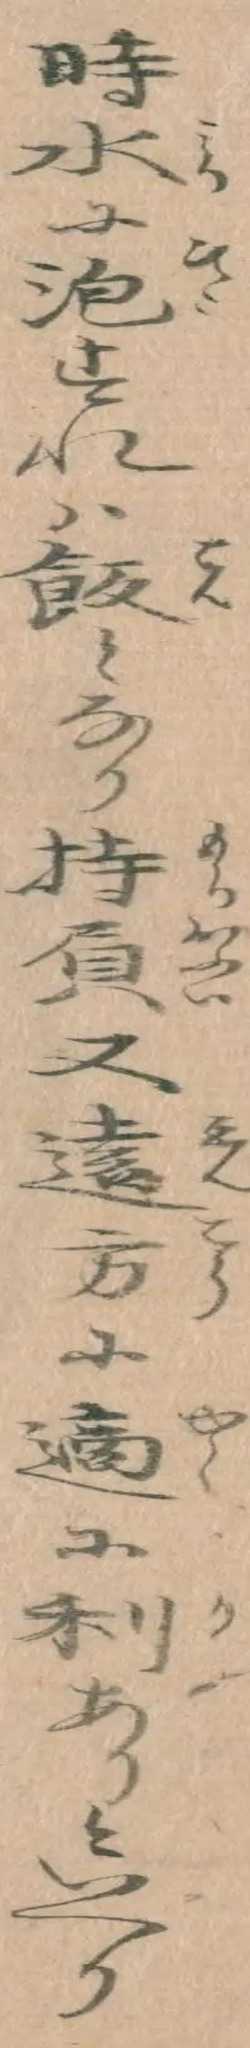時水に泡すれは飯となり持屓又遠方に適に利ありといへり
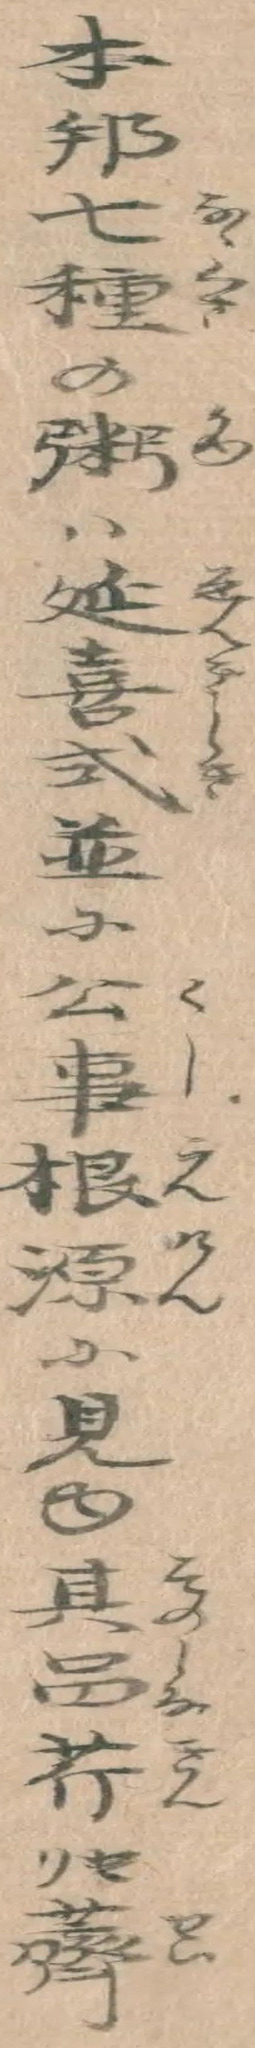本邦七種の粥は延喜式並に公事根源に見ゆ其品芹せり薺

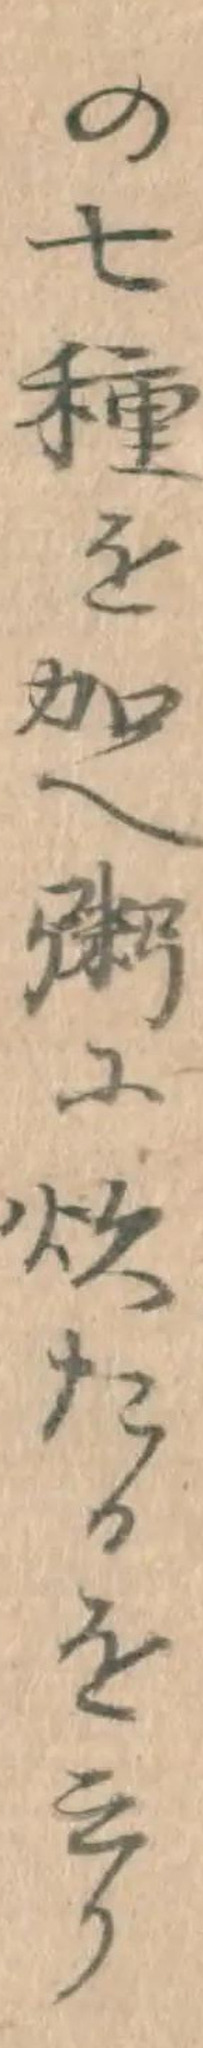の七種を加へ粥に炊たるを云り
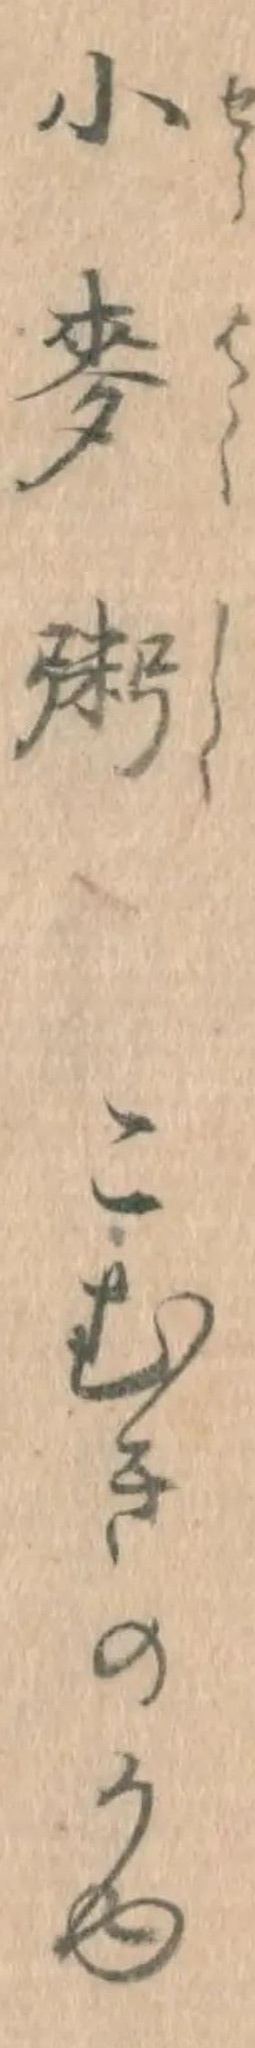小麦粥こむきのかゆ
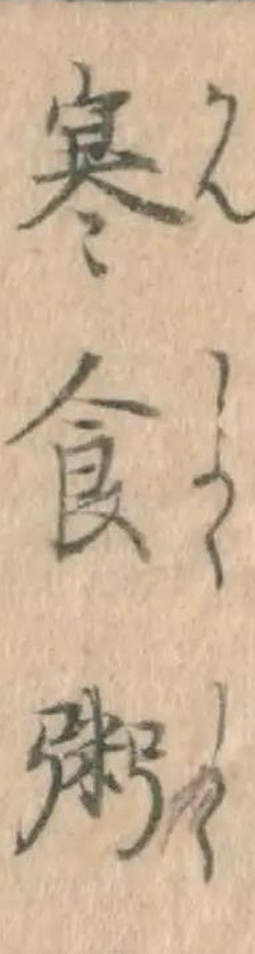寒食粥
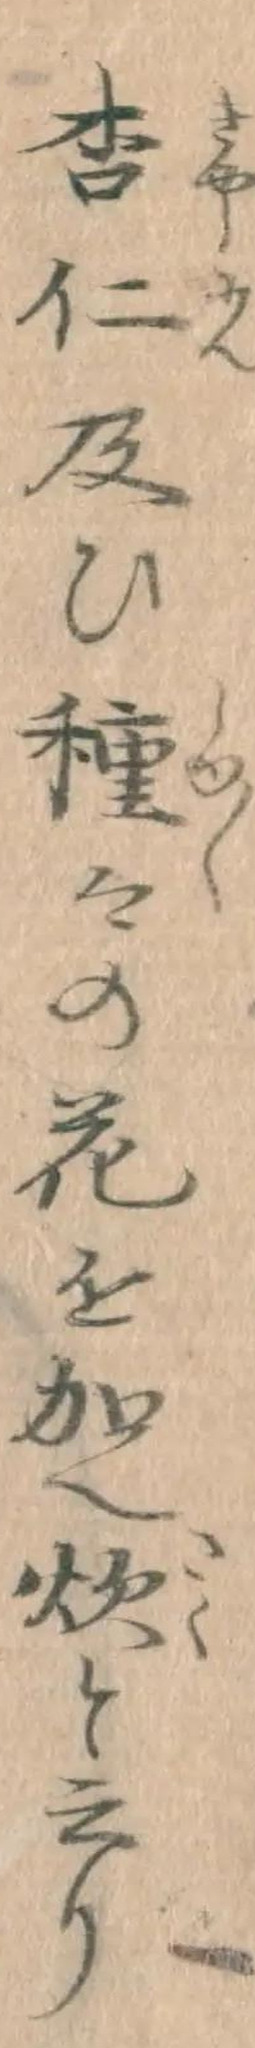杏仁及ひ種々の花を加へ炊と云り
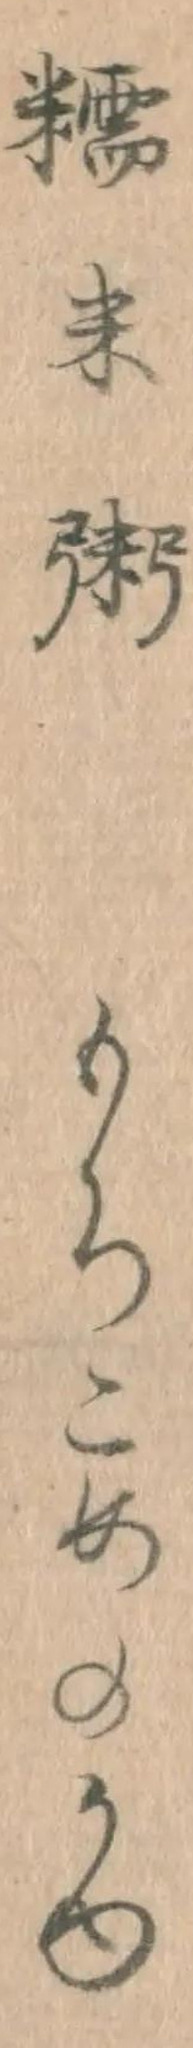糯米粥もちこめのかゆ
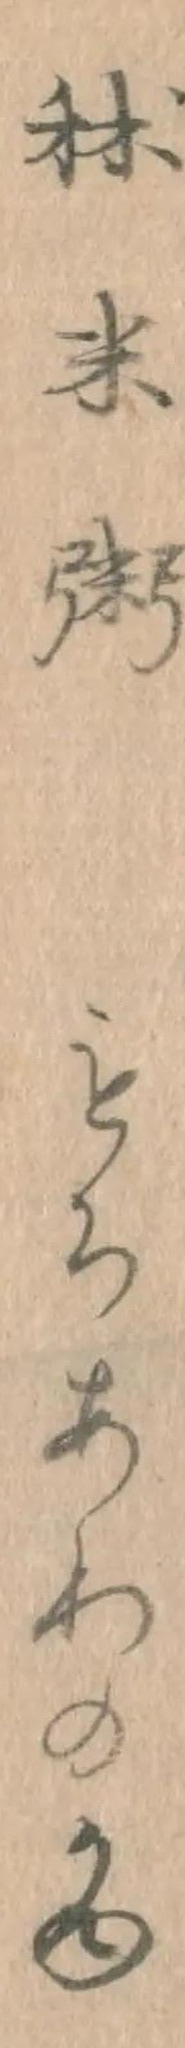秫米粥もちあわのかゆ
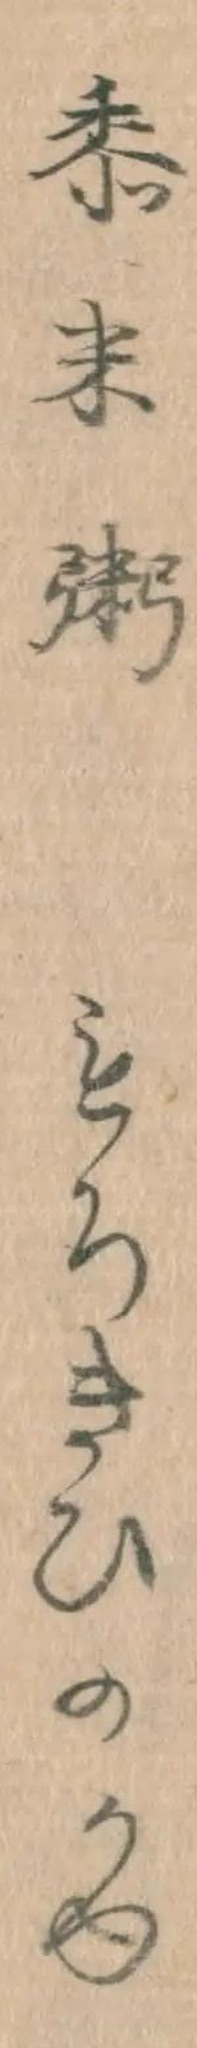黍米粥もろきひのかゆ
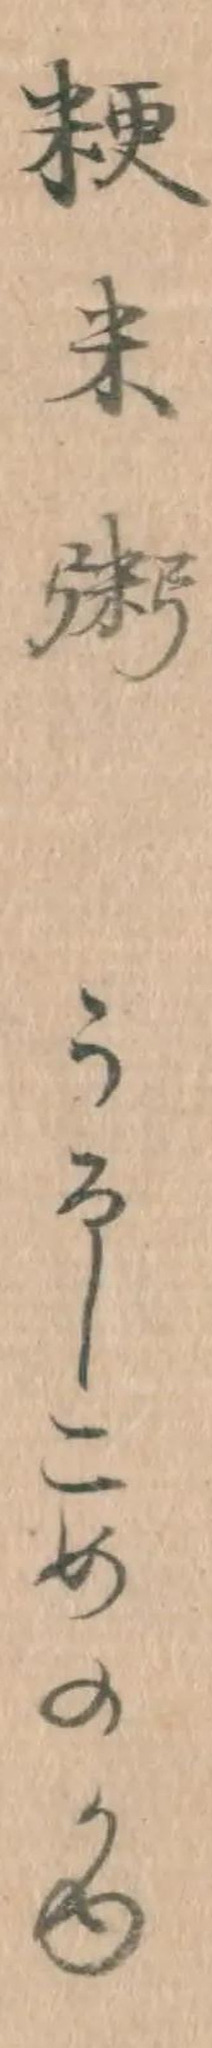粳米粥うるしこめのかゆ
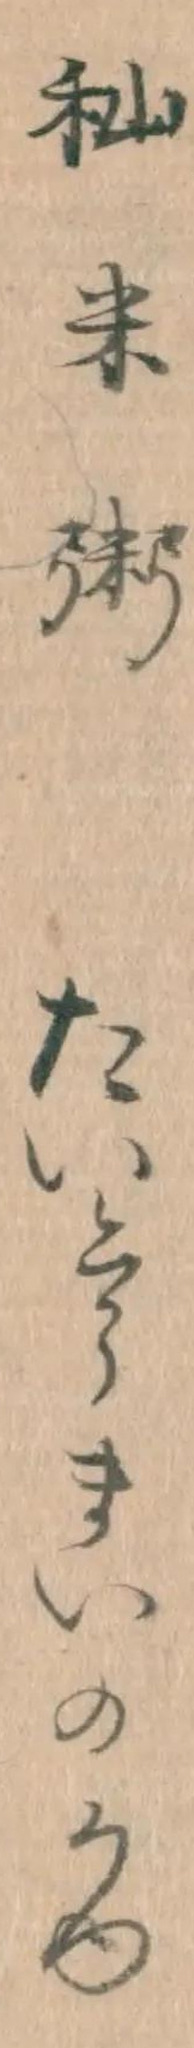秈米粥たいとうまいのかゆ
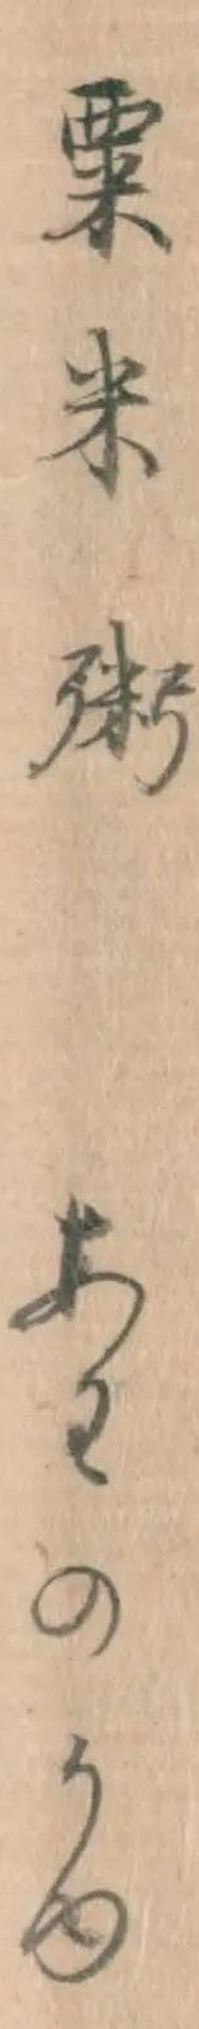粟米粥あわのかゆ
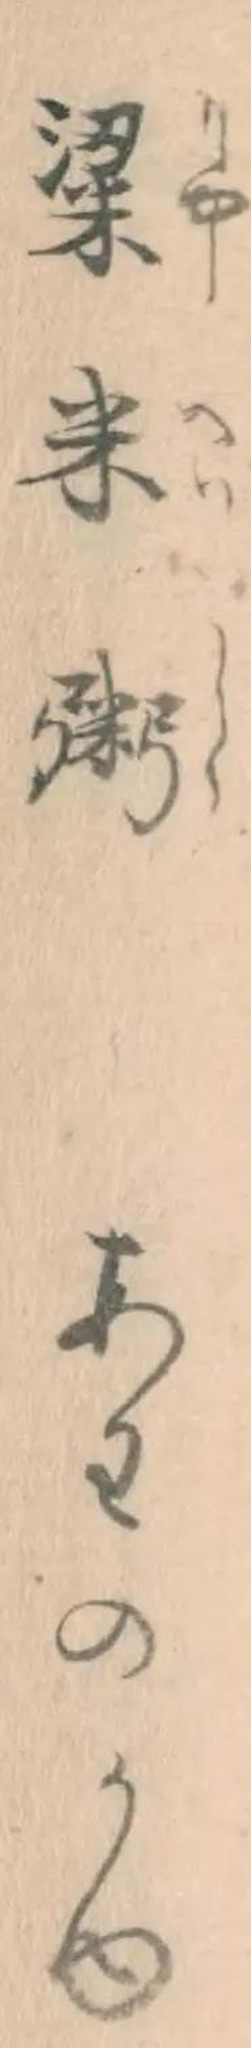粟米粥あわのかゆ
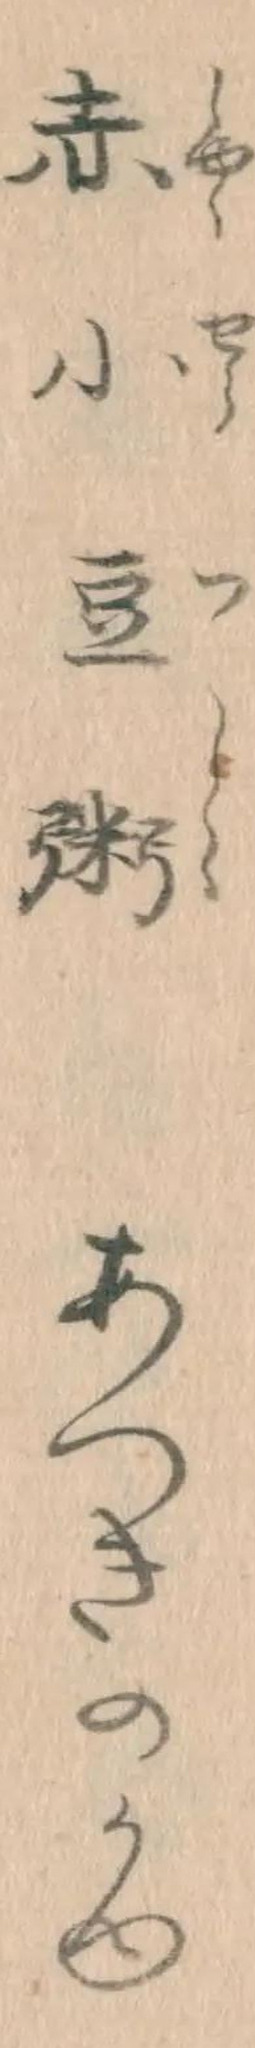赤小豆粥あつきのかゆ
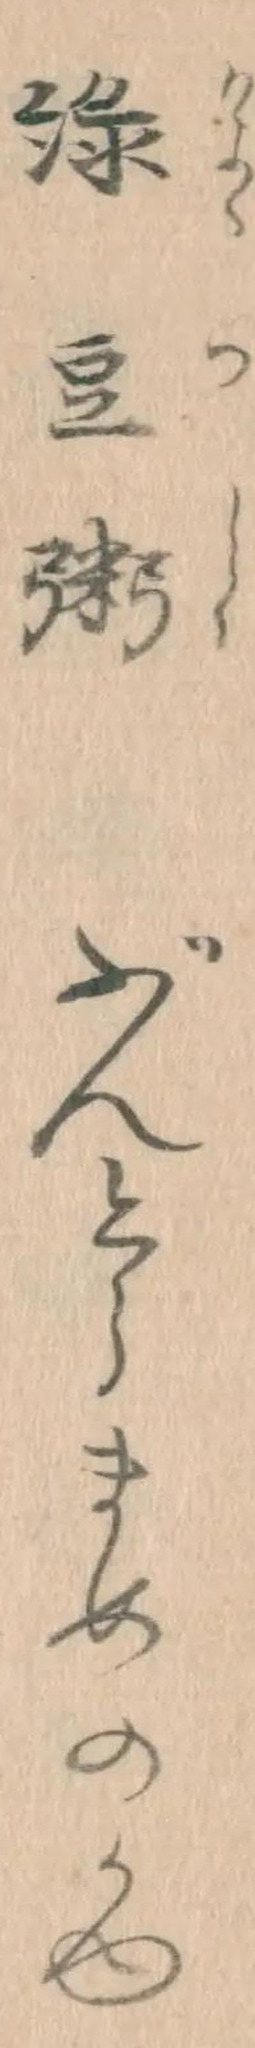緑豆粥ぶんとうまめのかゆ
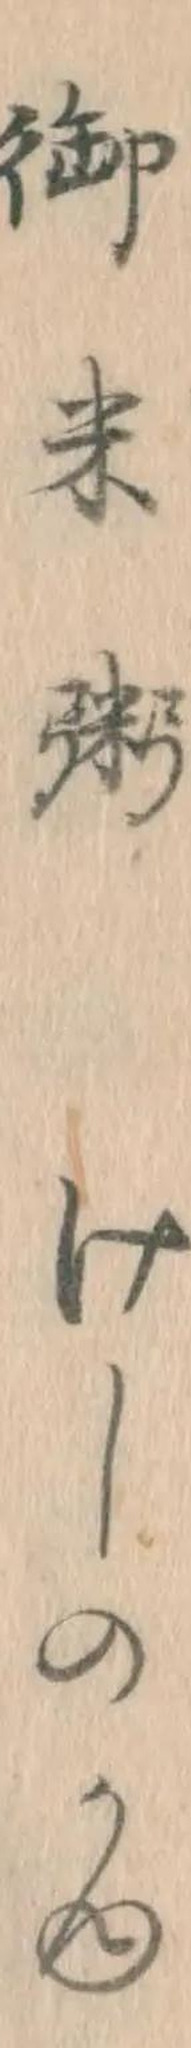御米粥けしのかゆ
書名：本草図譜. 巻43-45
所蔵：国立国会図書館 National Diet Library, JAPAN
